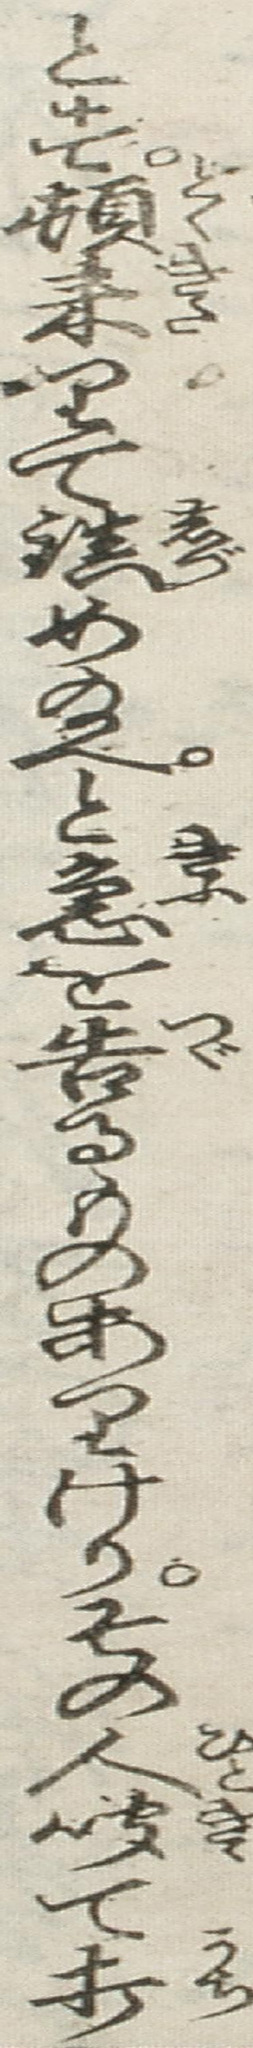とす。頓来りて鎮め給へ。と急を告るものありけり。その人聞て打
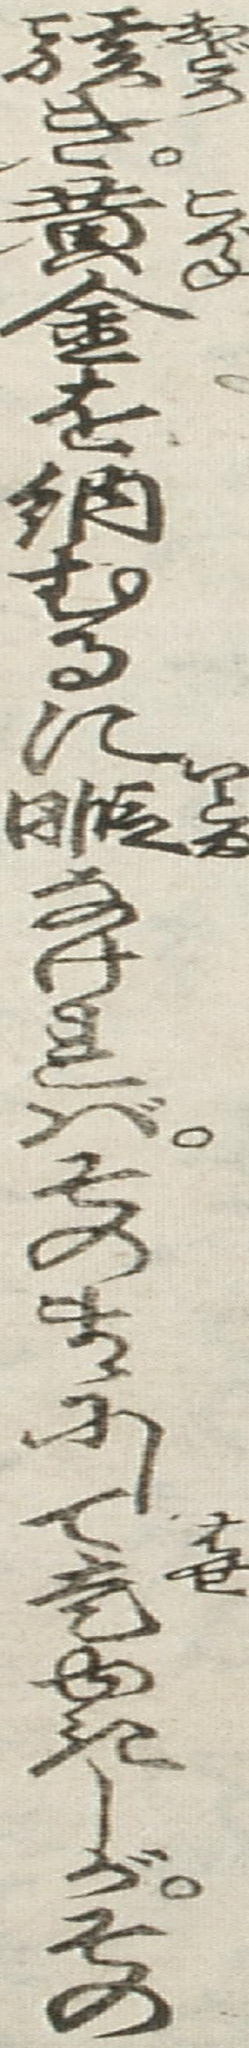駭き。黄金を納むるに暇なければ。そのまゝにして走ゆきしが。その
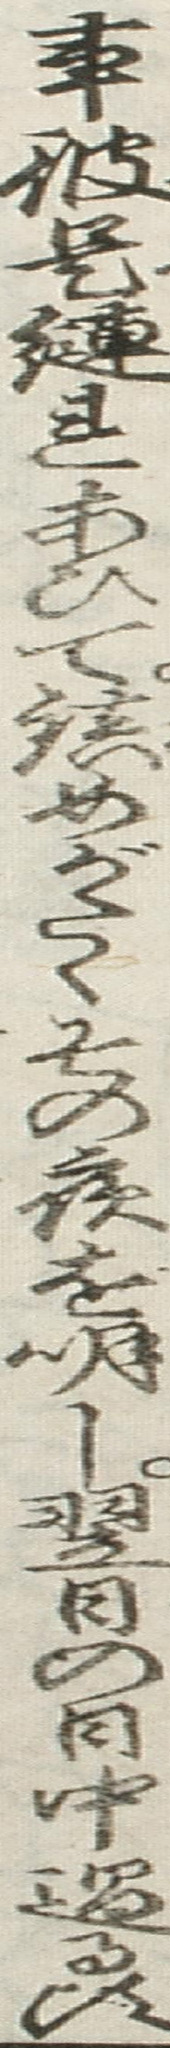事彼是縺れあひて。鎮めがたくその夜を明し。翌日の日中過る頃。
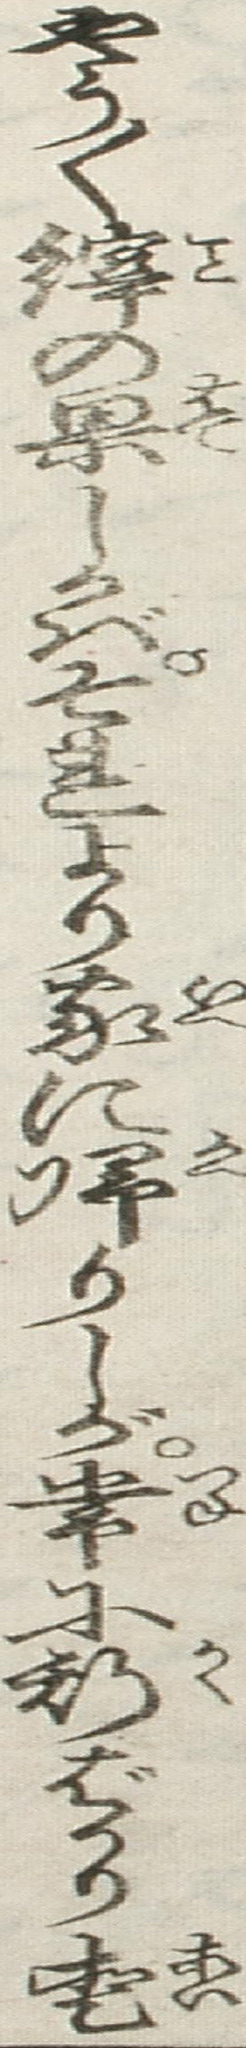やう〳〵縡の果しかば。それより家に帰りしが。常に斯ばかり愛
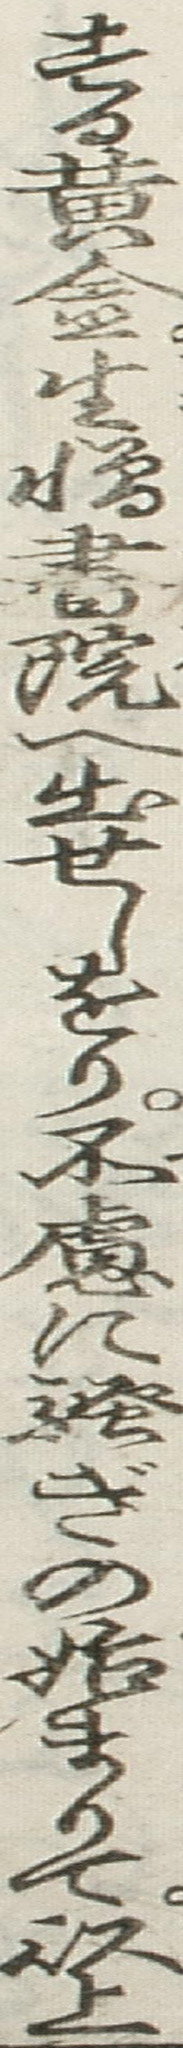する黄金。生憎書院へ出せしをり。不慮に騒ぎの始まりて。以上
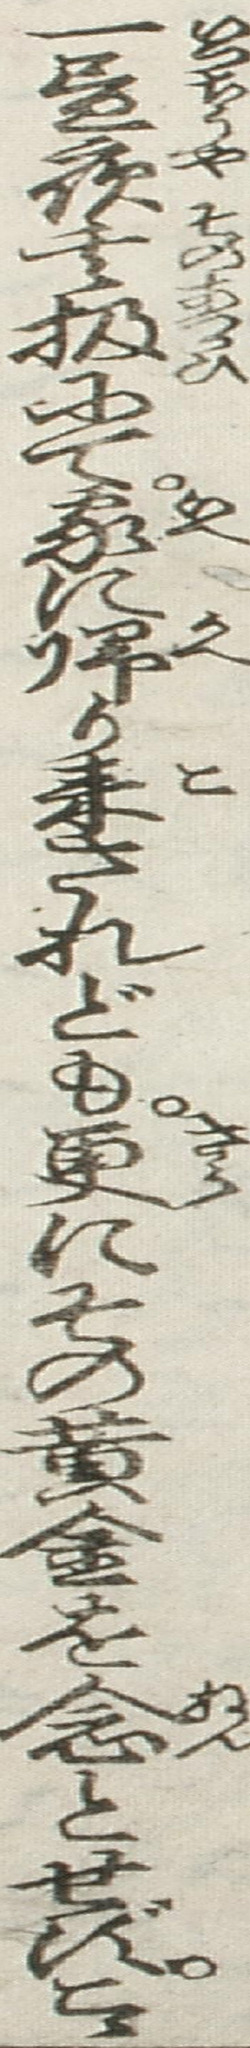一昼夜其扱にて。家に帰り来されども。更にその黄金を念とせず。こゝ
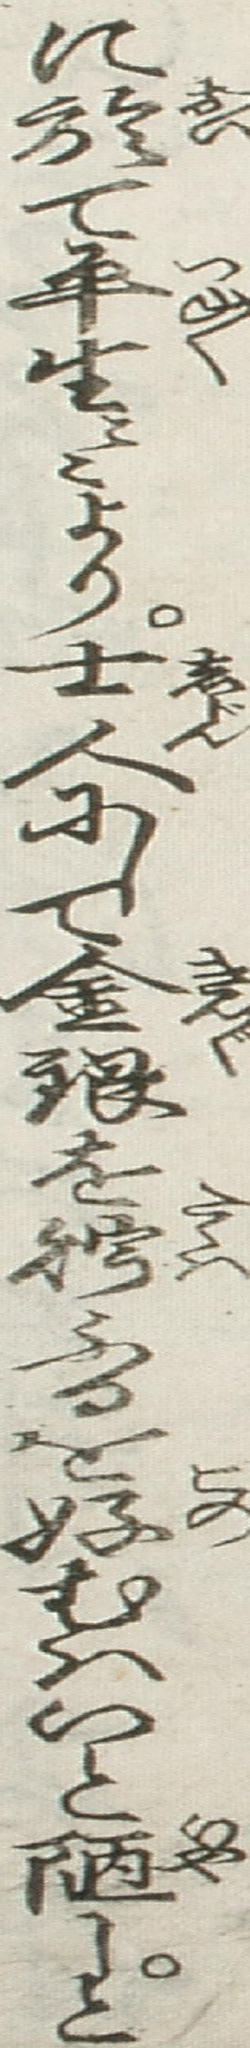に於て平生〻〻より。士人にして金銀を貯ふるを好むはいと陋し。と
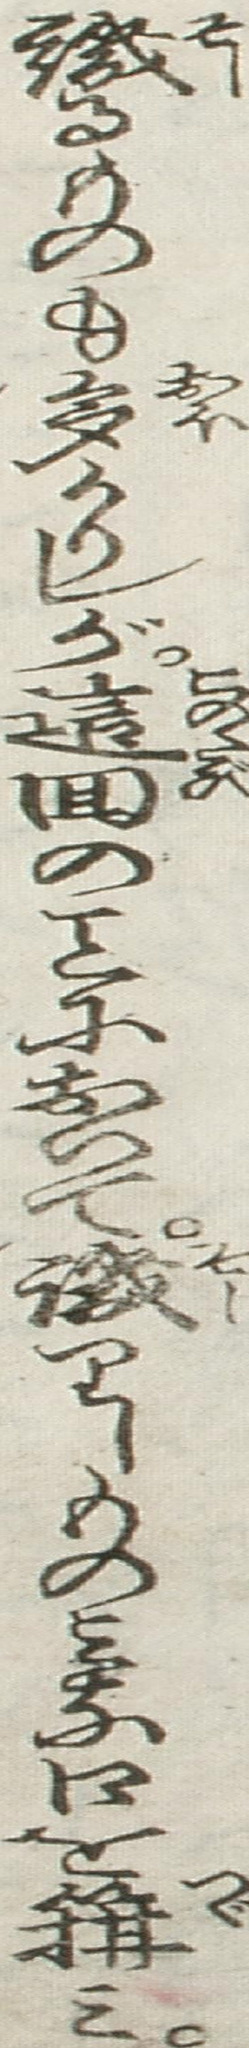譏るものも多かりしが。這回のことにおいて。譏りしものみな口を箝み。
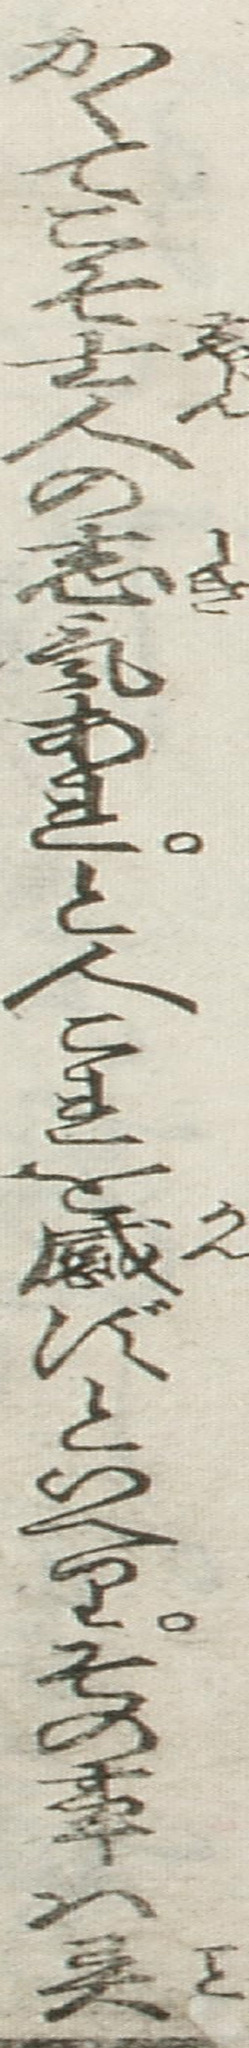かくてこそ士人の志気あれ。と人これを感ずといへり。その事は異
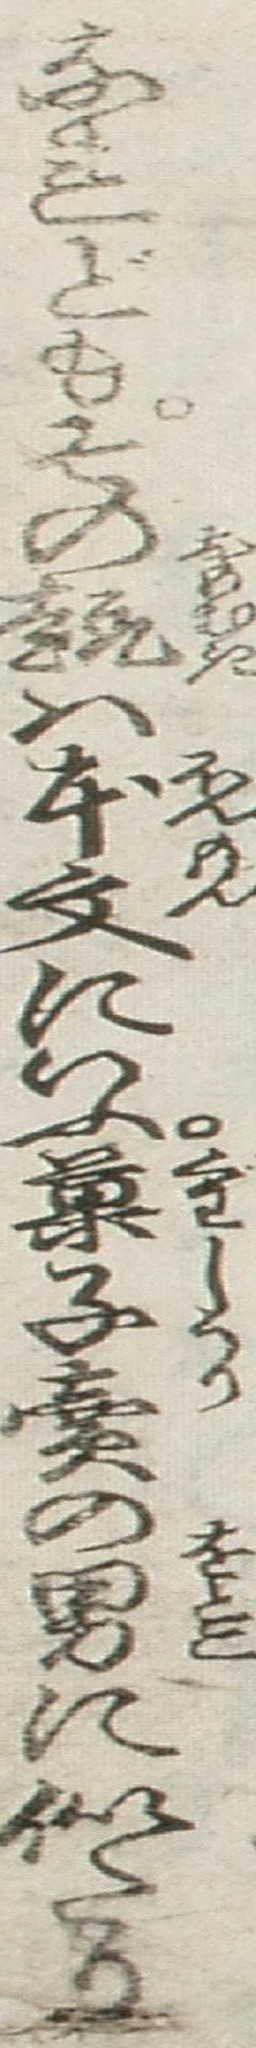なれども。その趣は本文にいふ。菓子売の男に似たり

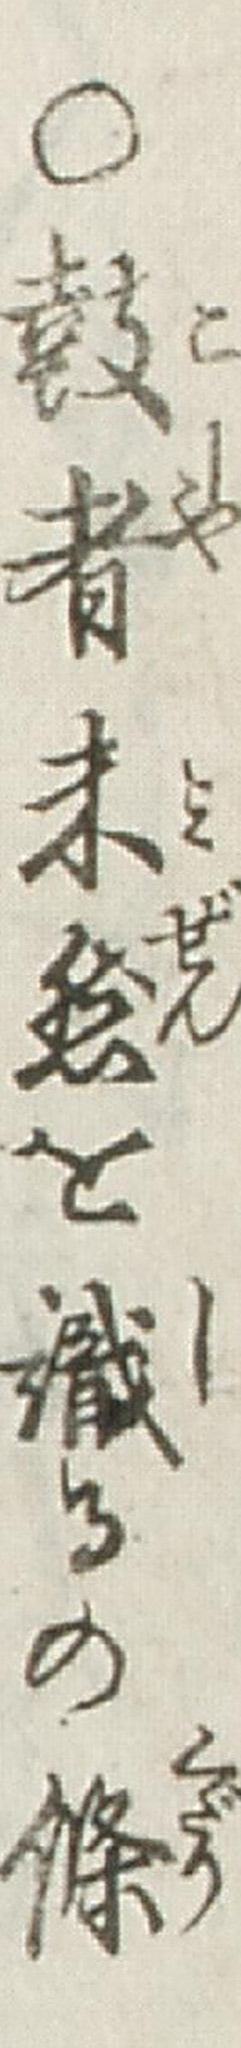〇鼓者未然を識るの條
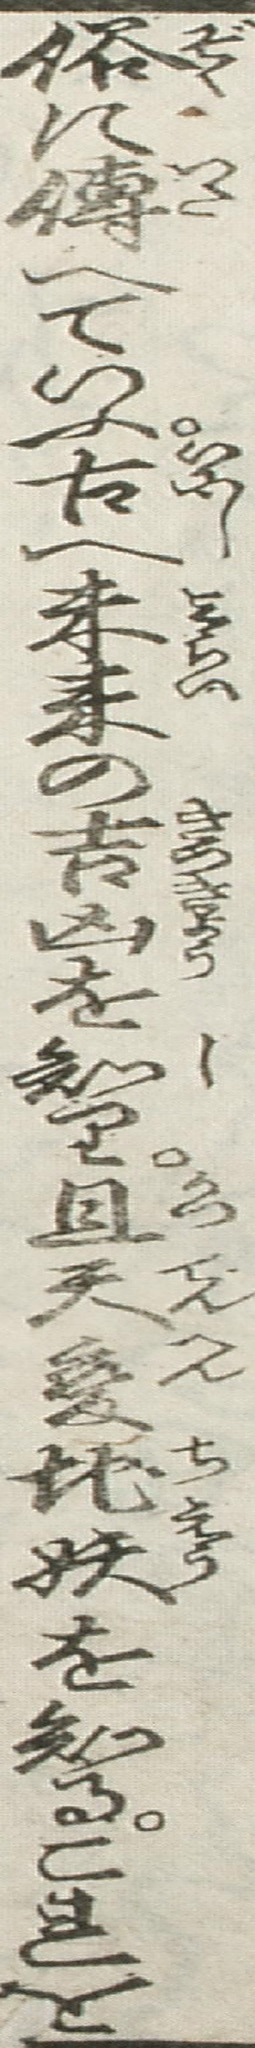俗に伝へていふ。古へ未来の吉凶を知り。且天変地妖を知る。これを
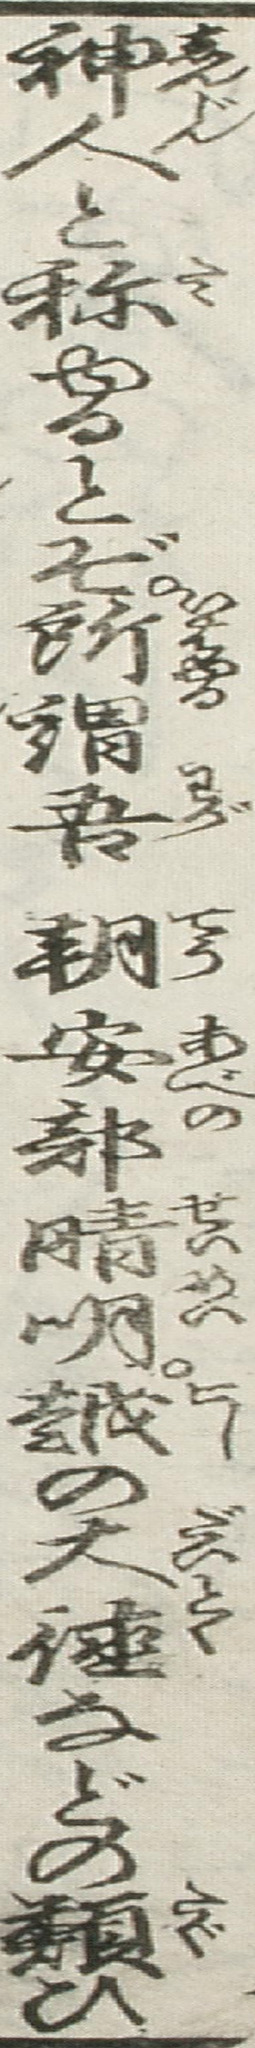神人と称ゆるとぞ。所謂吾朝安部晴明。越の大徳などの類ひ
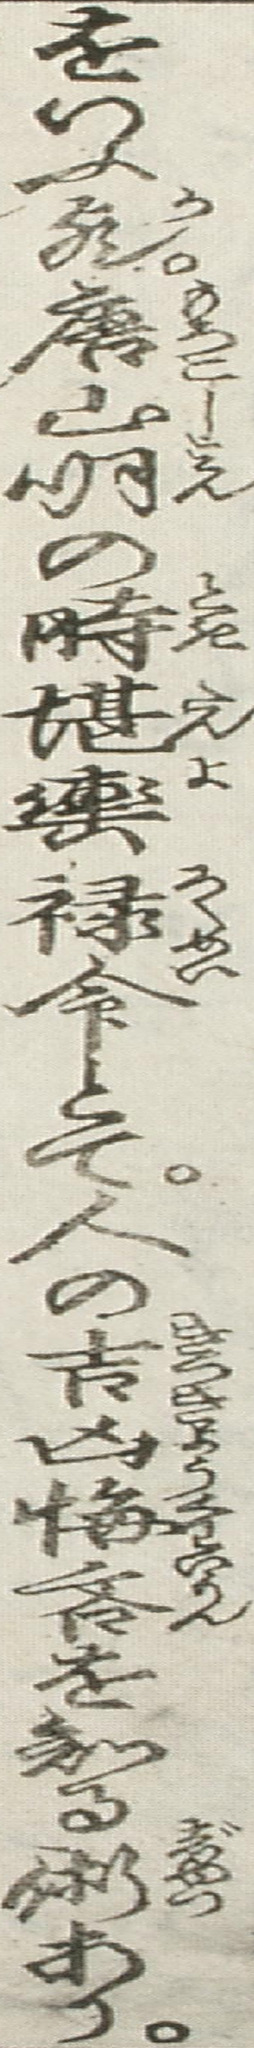をいふ歟。唐土明の時堪輿禄命とて。人の吉凶悔吝を知る術あり。
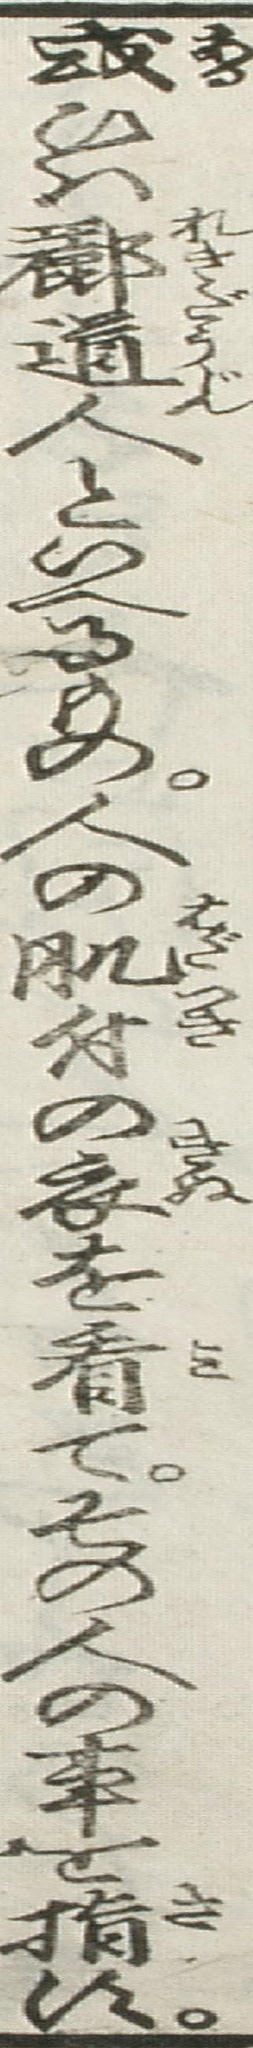或ひは酈道人といへるもの。人の肌付の衣を看て。その人の事を指す。
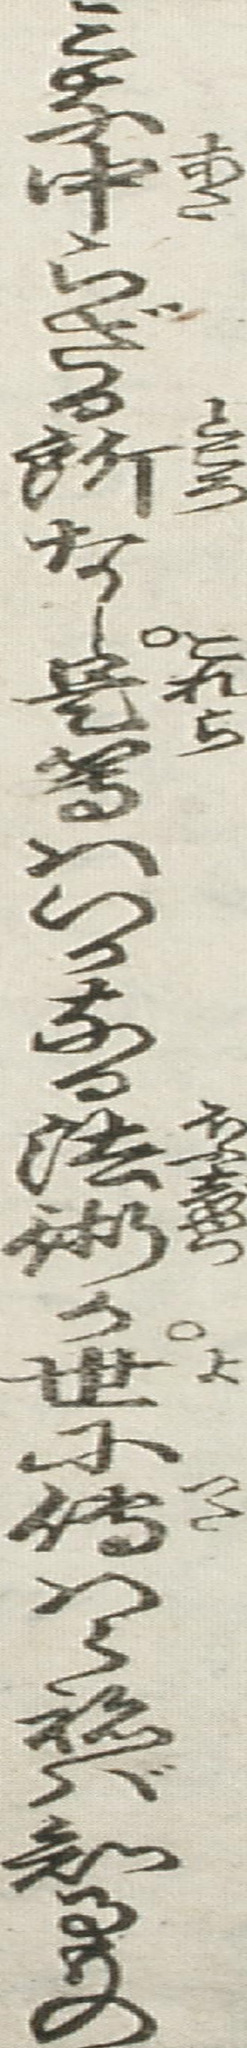みな中らざる所なし。是等はいかなる法術か。世に伝はらねば知るもの
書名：安政見聞録　下
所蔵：東京大学地震研究所図書室 Earthquake Research Institute Library, The University of Tokyo, JAPAN
